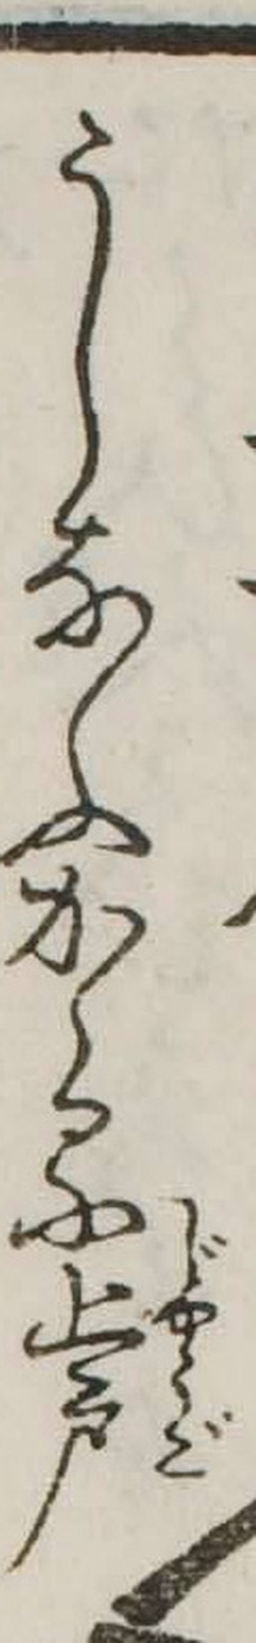うしなふかゝる上戸
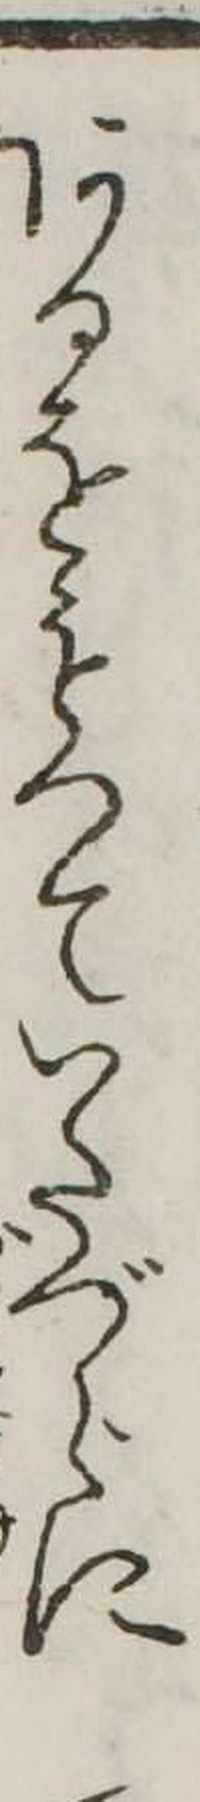あるをもつていたづらに
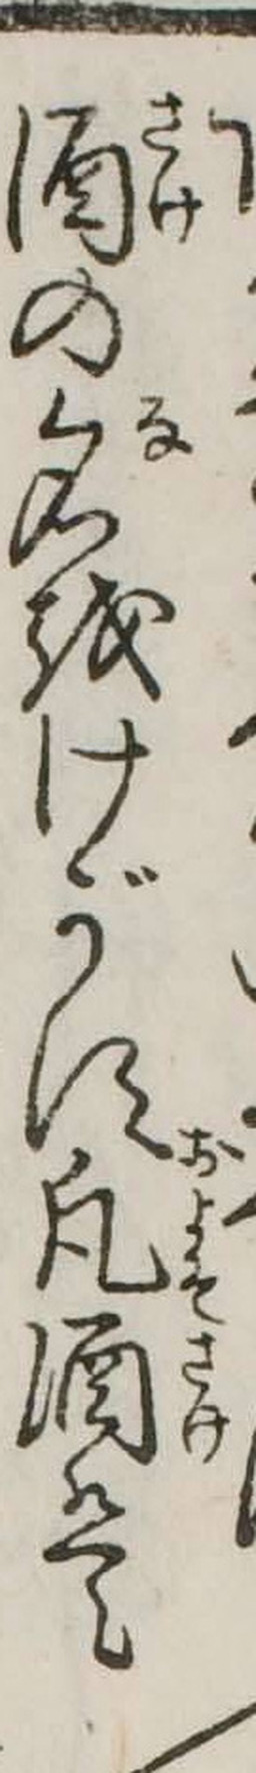酒の名をけがす凡酒は
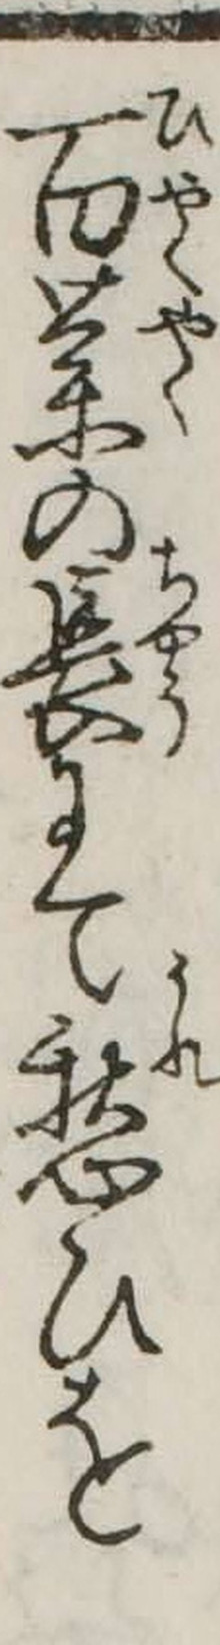百薬の長にて愁ひを
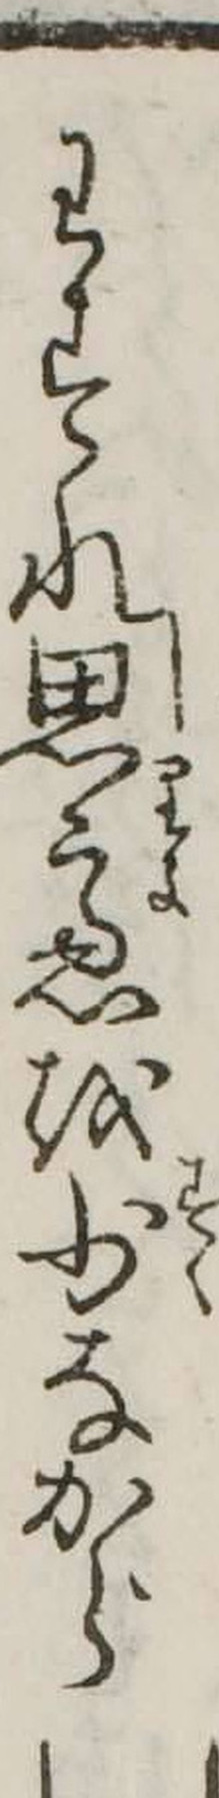わすれ思慮を少なから
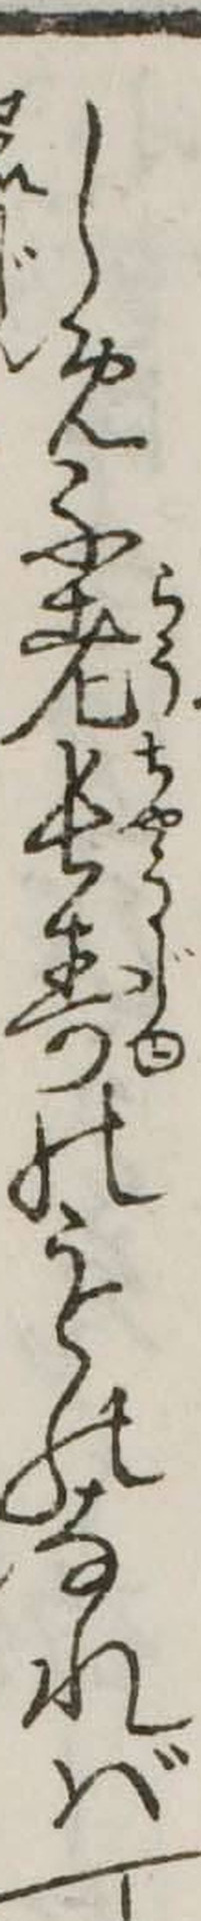しめ不老長寿のものなれば
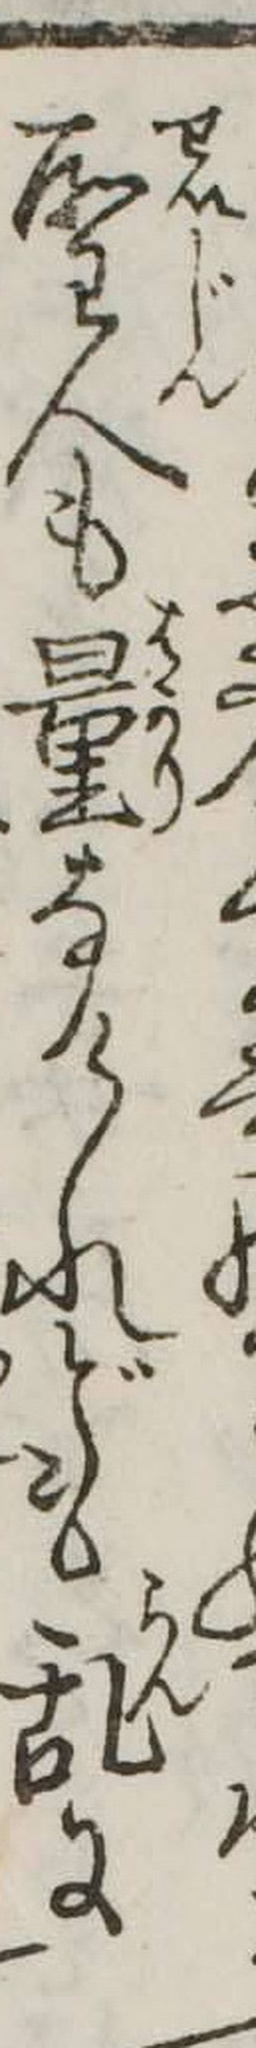聖人も量なけれども乱に
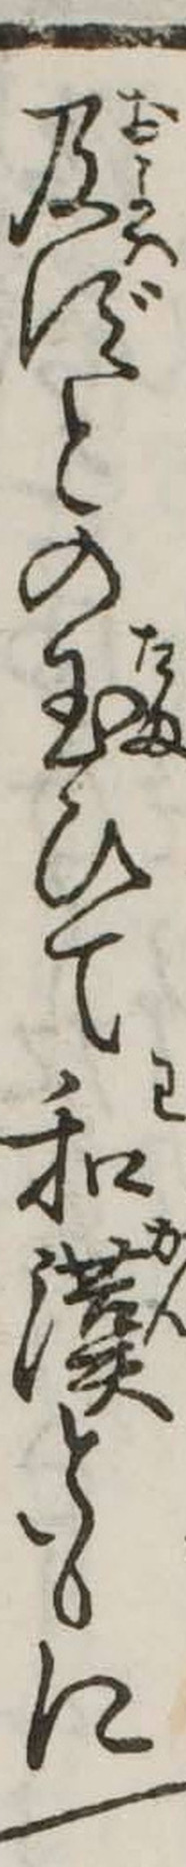及ずとの玉ひて和漢ともに
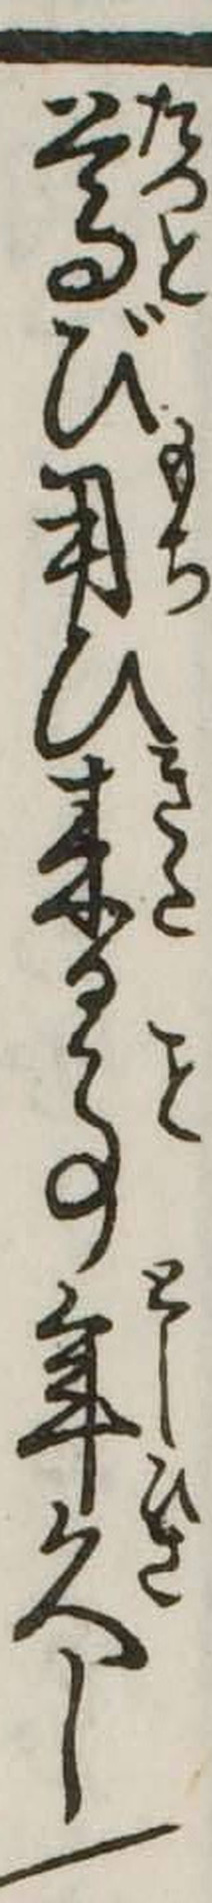尊び用ひ来る事年久し
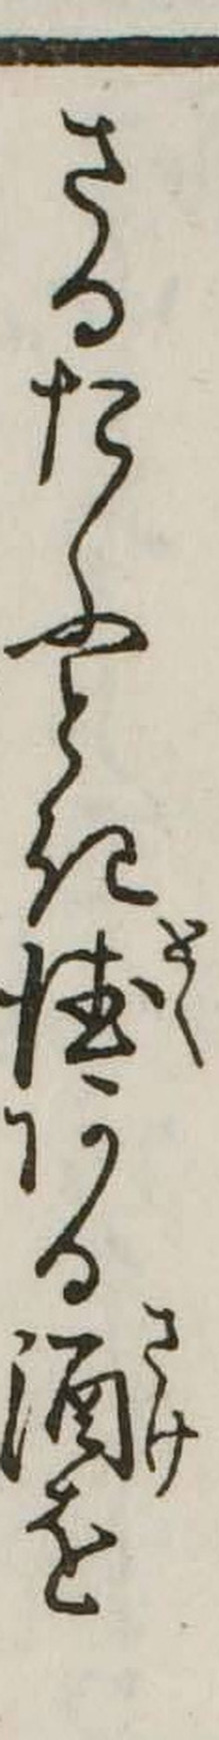さるたふとき徳ある酒を
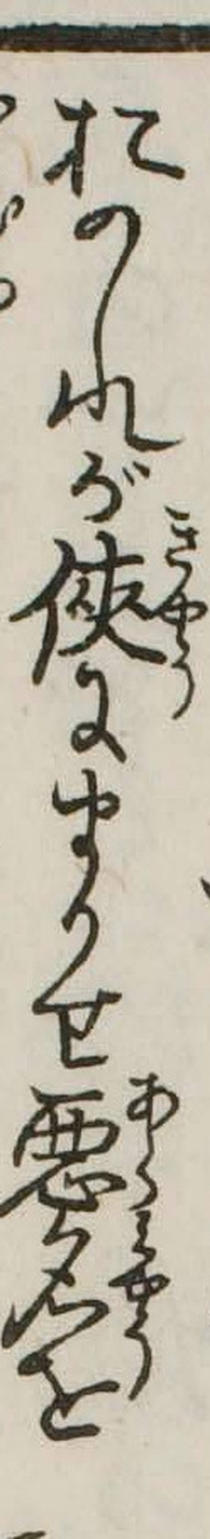おのれが侠にまかせ悪名を
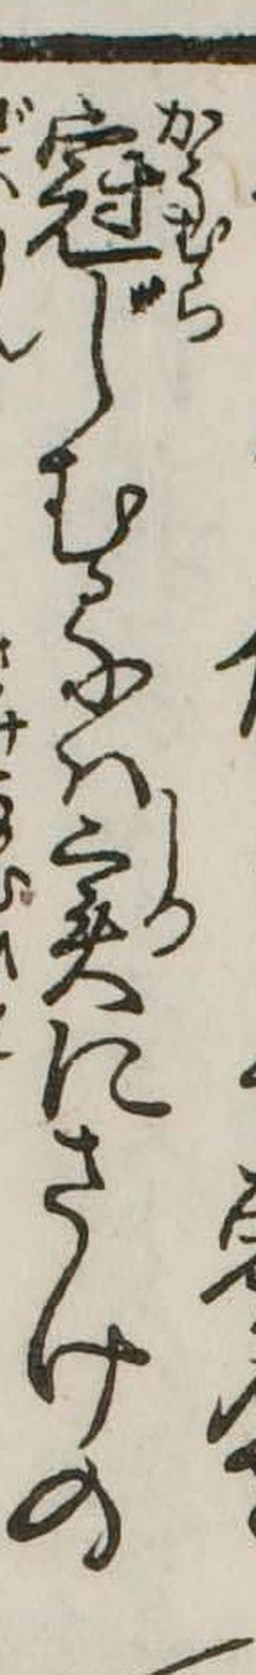冠じむるは実にさけの
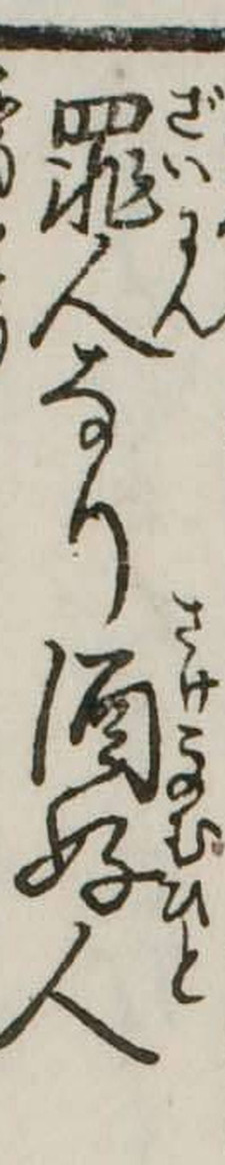罪人なり酒好人
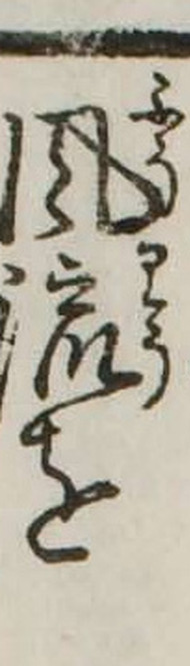風流を
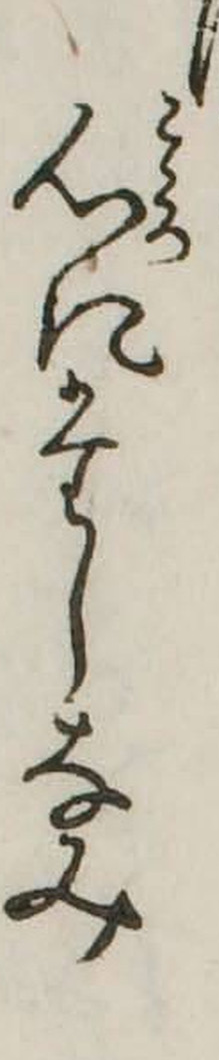心にたしなみ
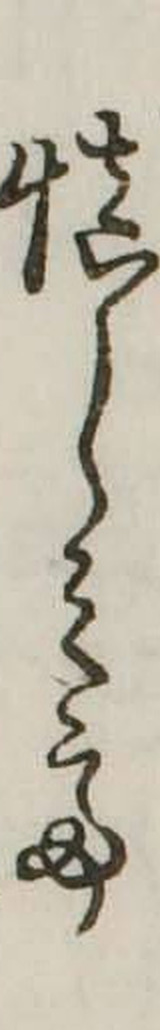慎しみて
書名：繪本不盡泉
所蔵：国文学研究資料館
